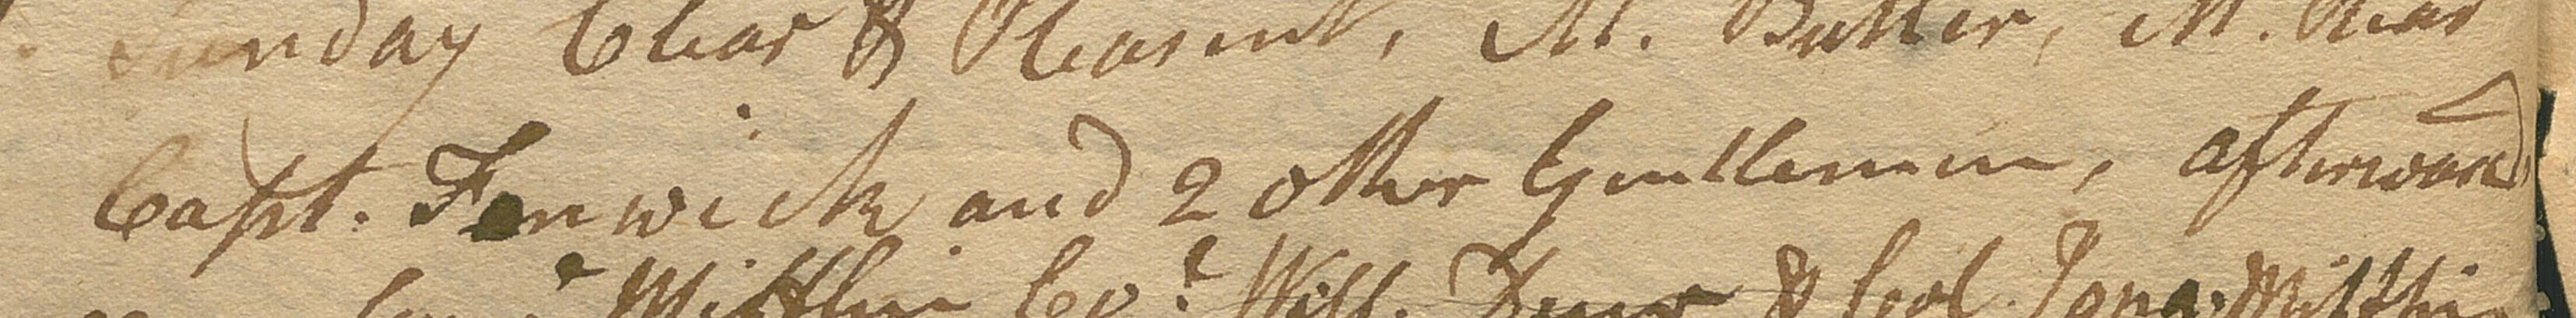Capt. Fenwick and 2 other Genllemen, afterward
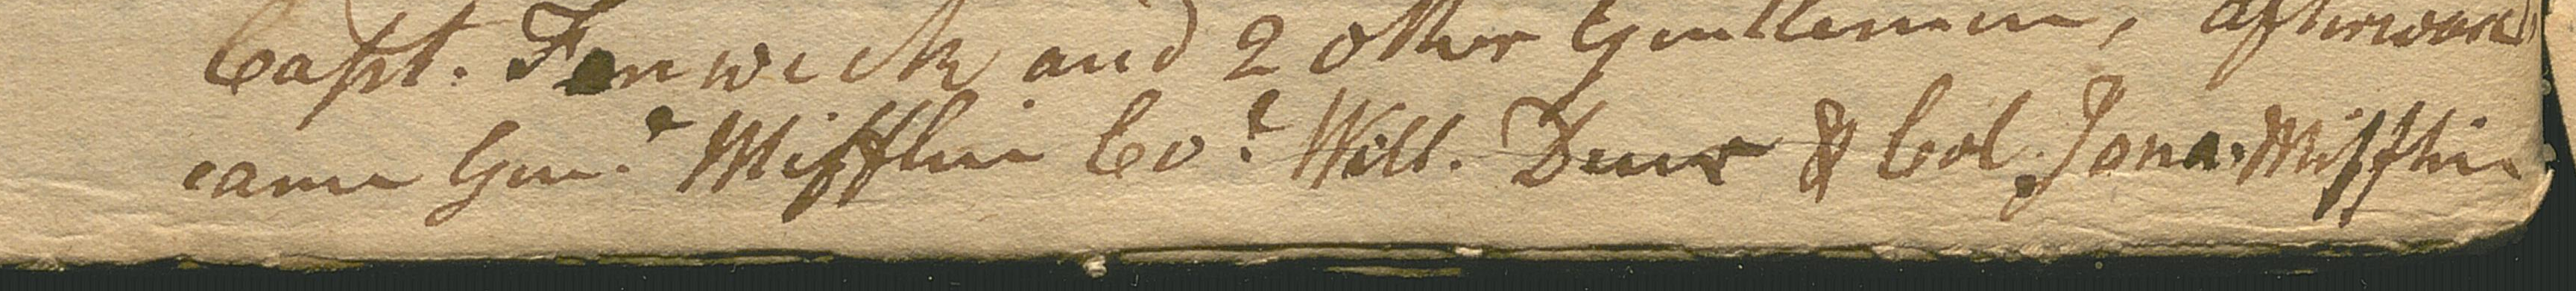came Gen^l. Mifflin Co^l. Will. Dent & Col Jona Mifflin
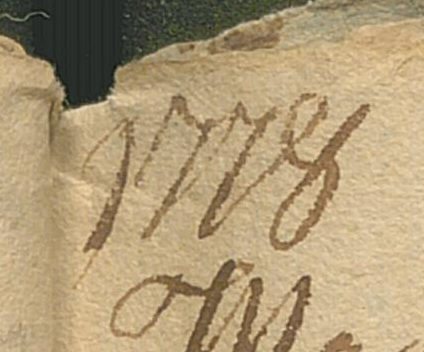1778
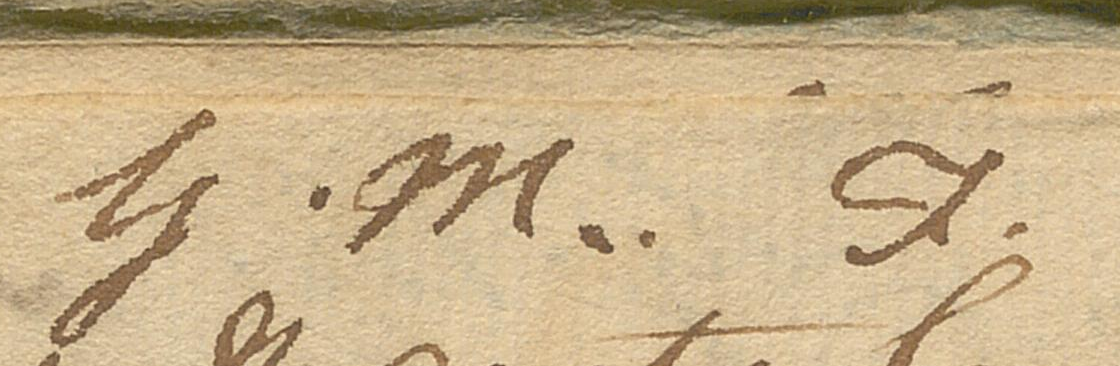G .M. F.
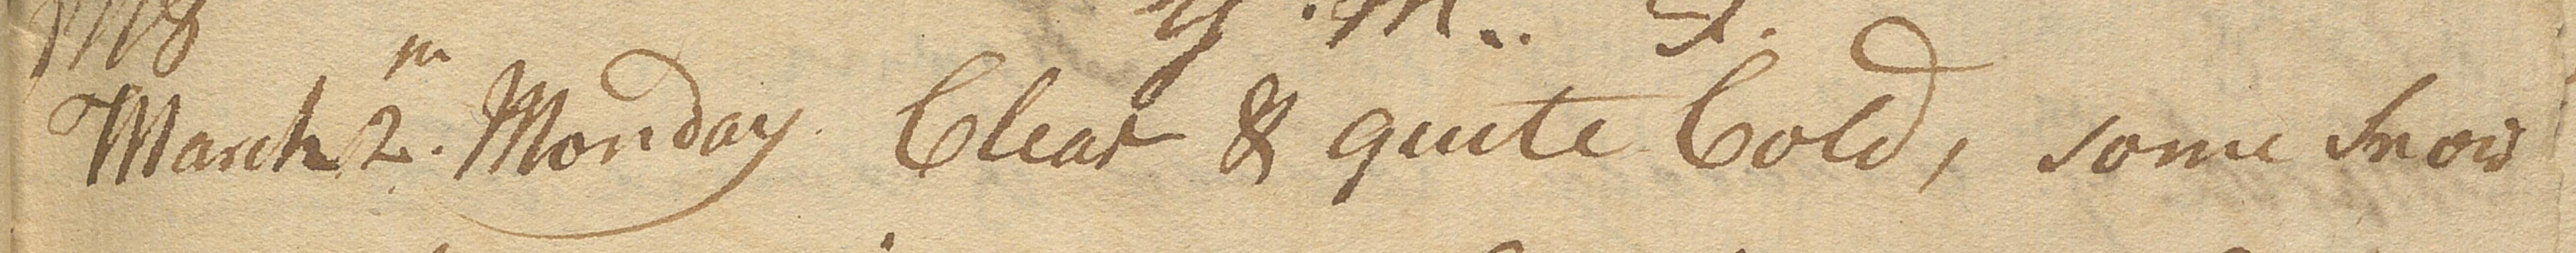March 2^th. Monday. Clear & quite Cold, some snow
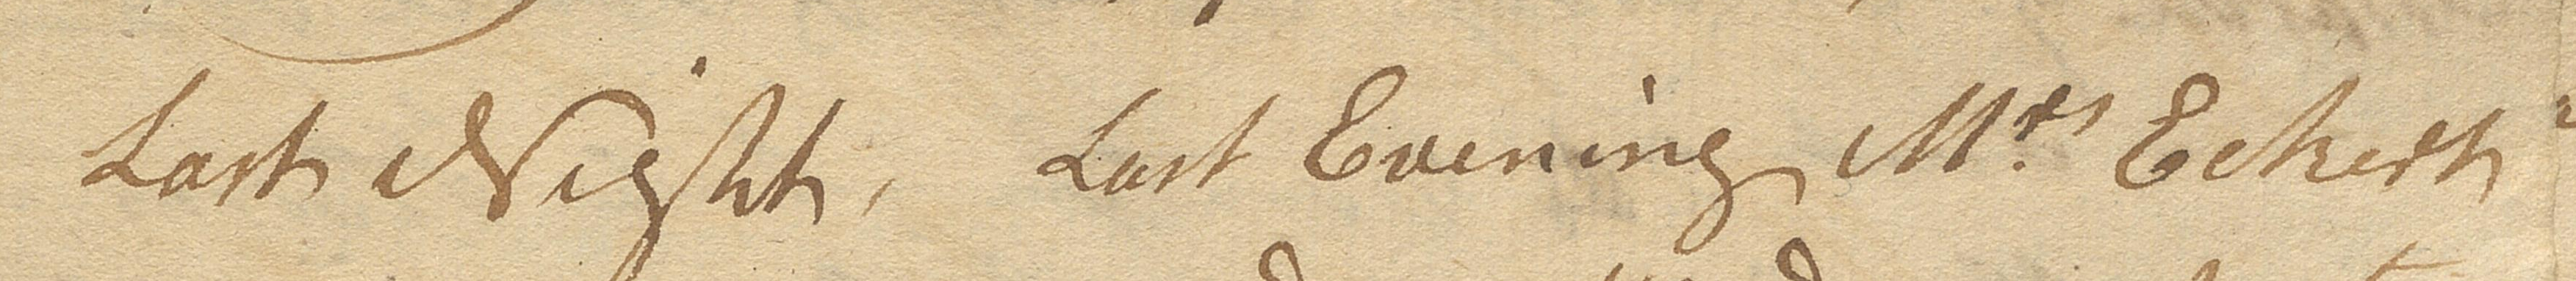Last Night, Last Evening M^rs. Eckert
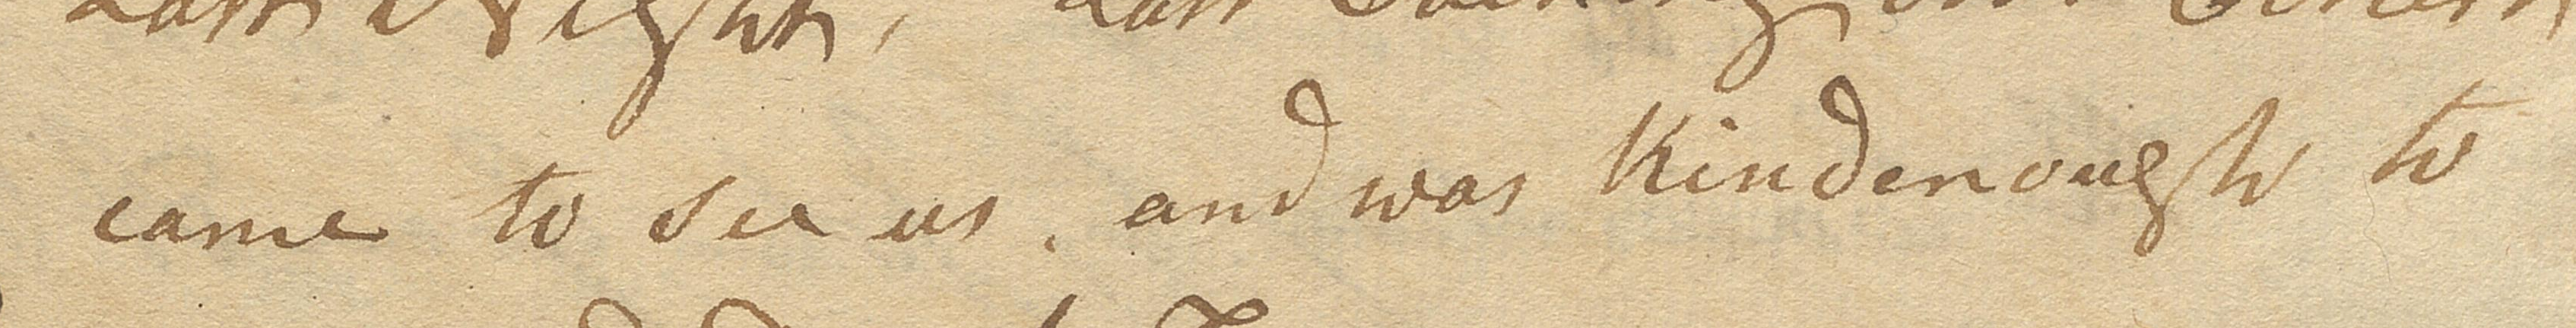came to see us, and was Kind enough to
